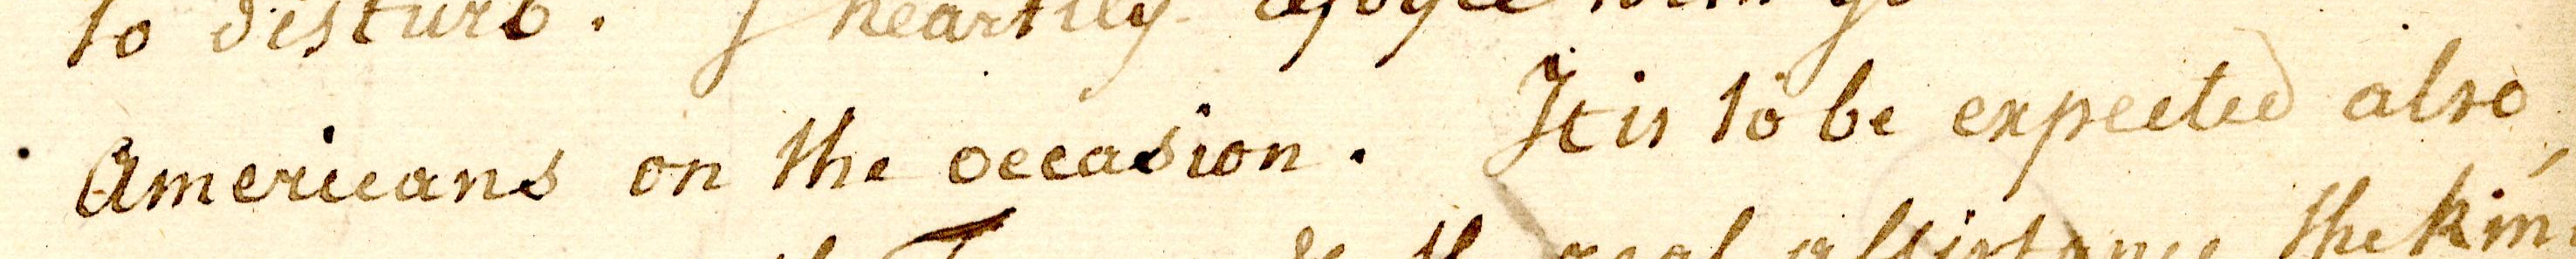Americans on the occasion. It is to be expected also
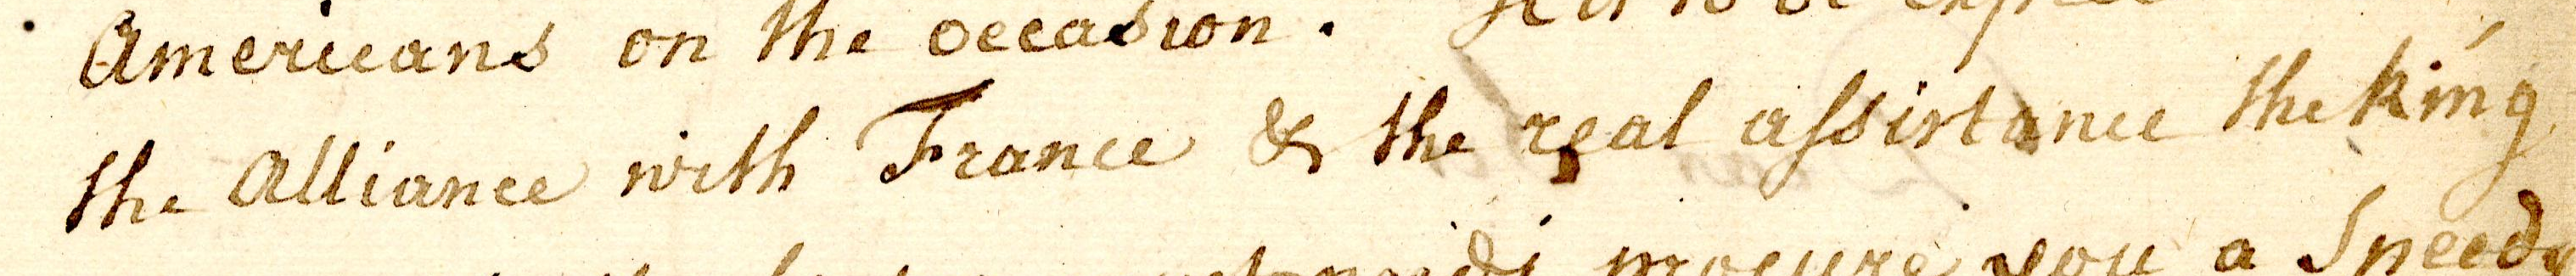the Alliance with France & the real assistance the king
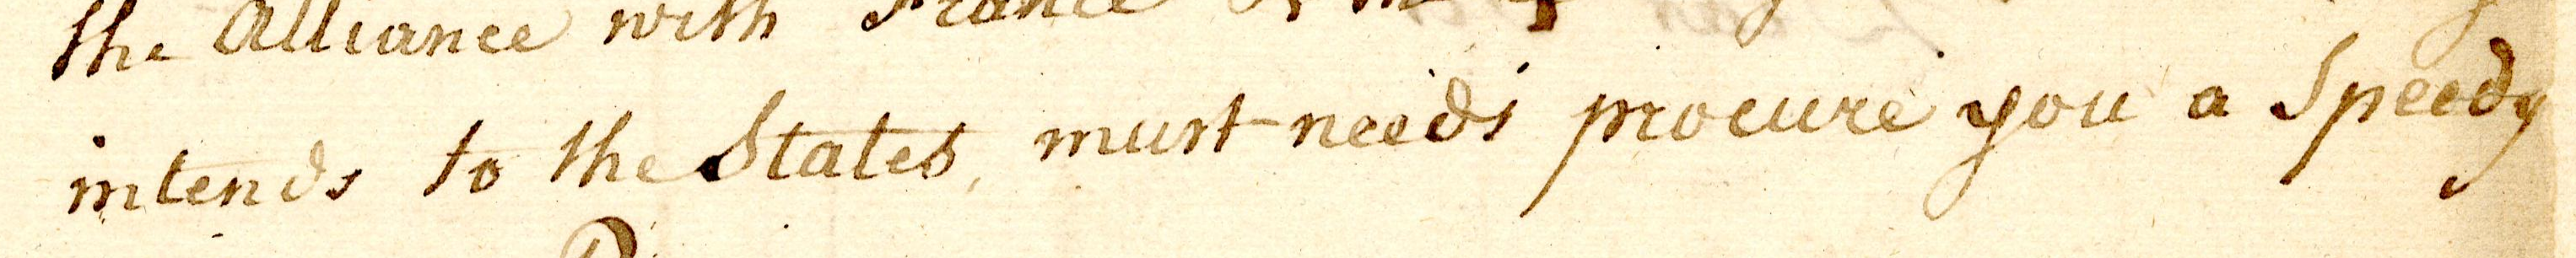intends to the states must needs procure you a Speedy
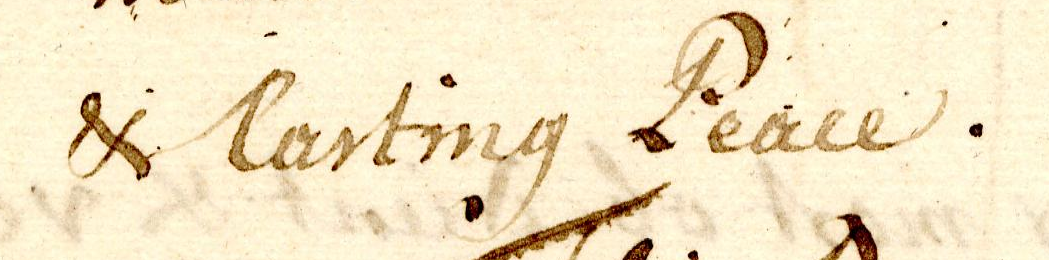& lasting Peace.
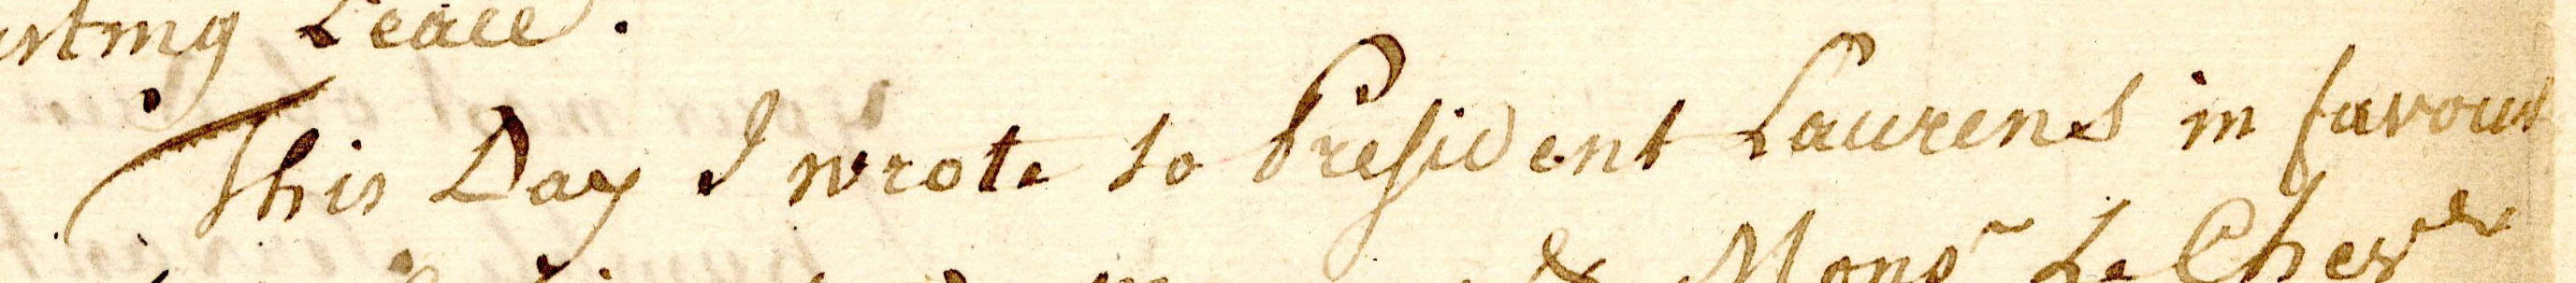This Day I wrote to President Laurens in favour
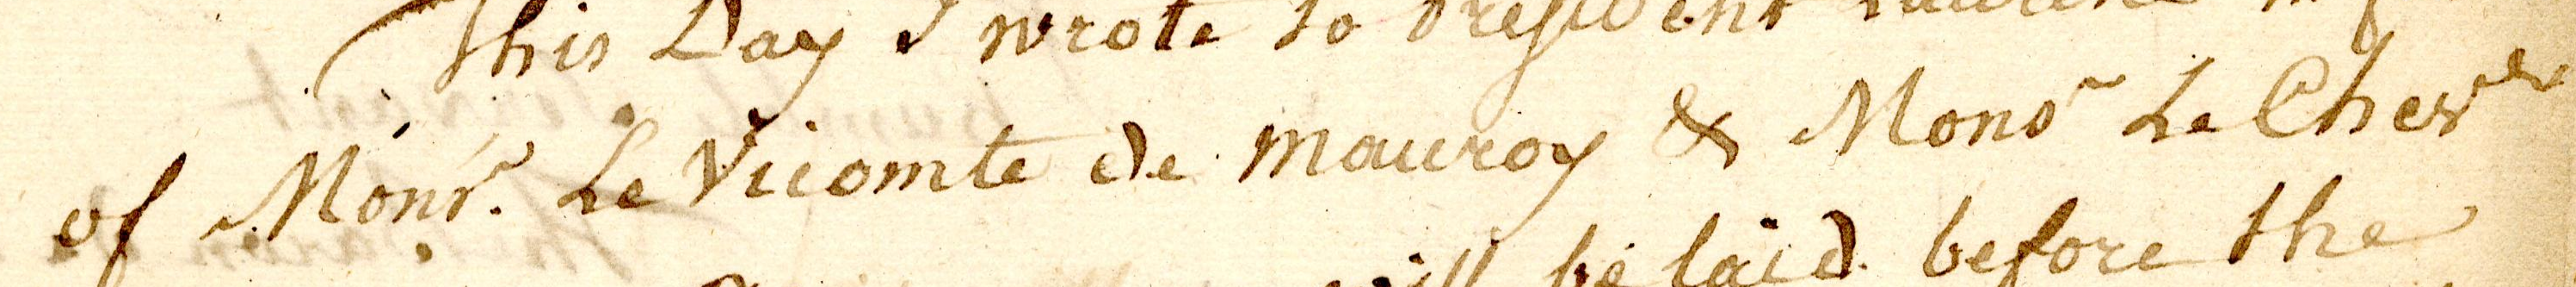of Mons^r. Le Vicomte de Mouroy & Mons^r Le Cher^e
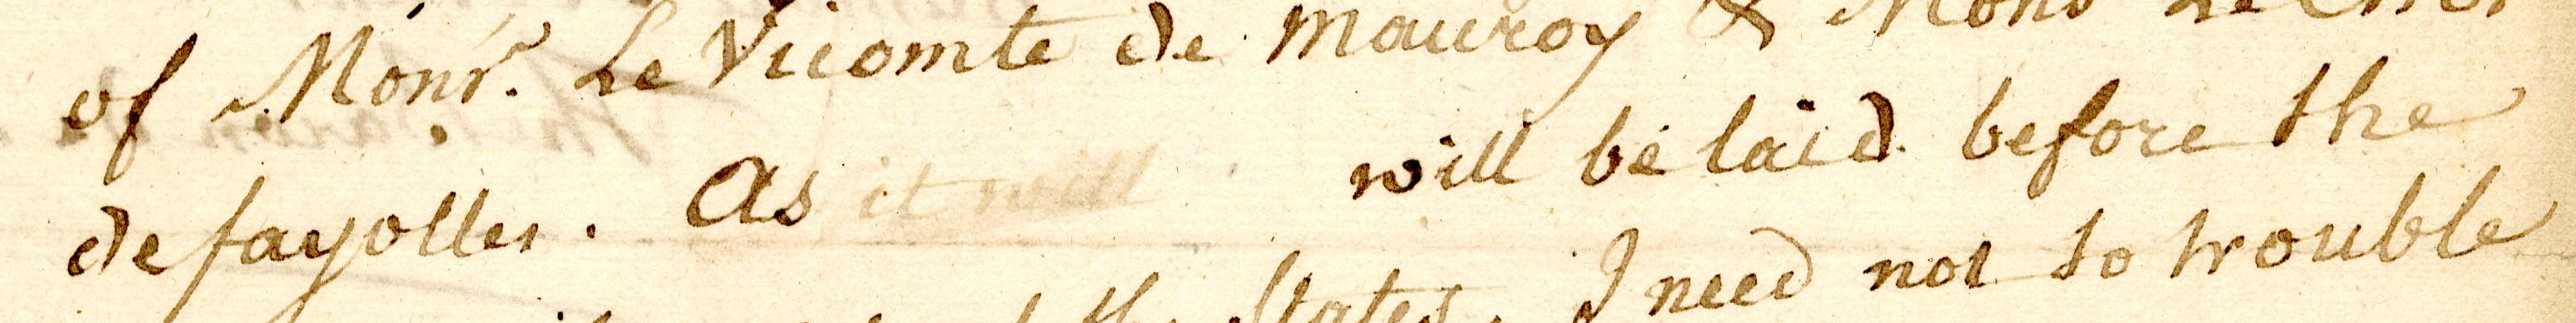de fayottes. As it will will be laid before the
